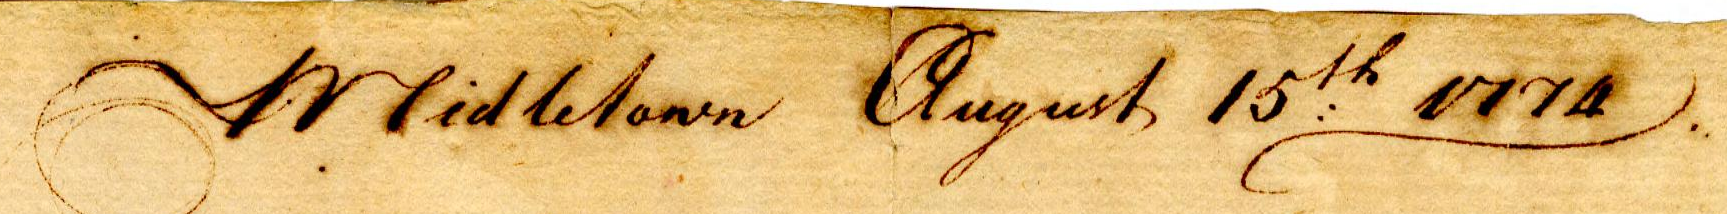Middletown August 15^th 1774
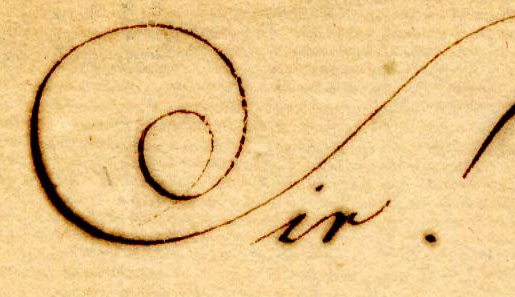Sir!
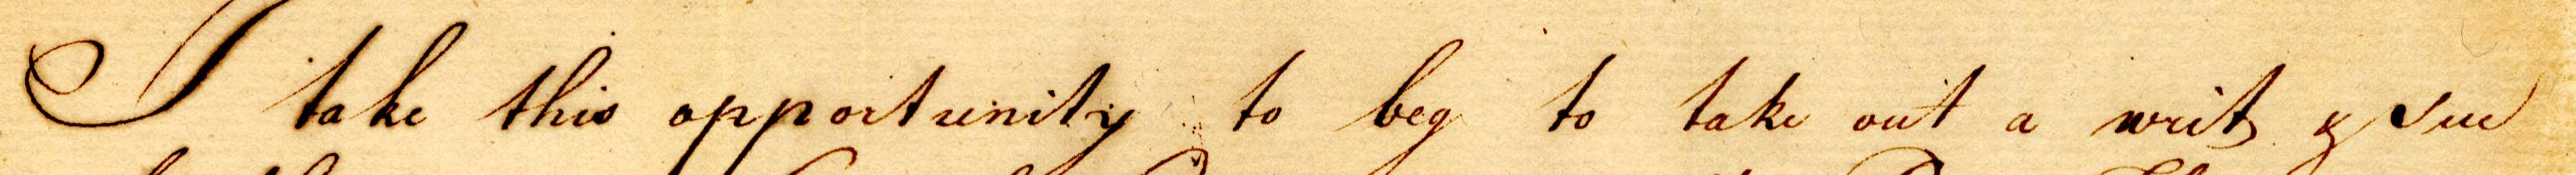I take this opportunity to beg to take out a writ & sue
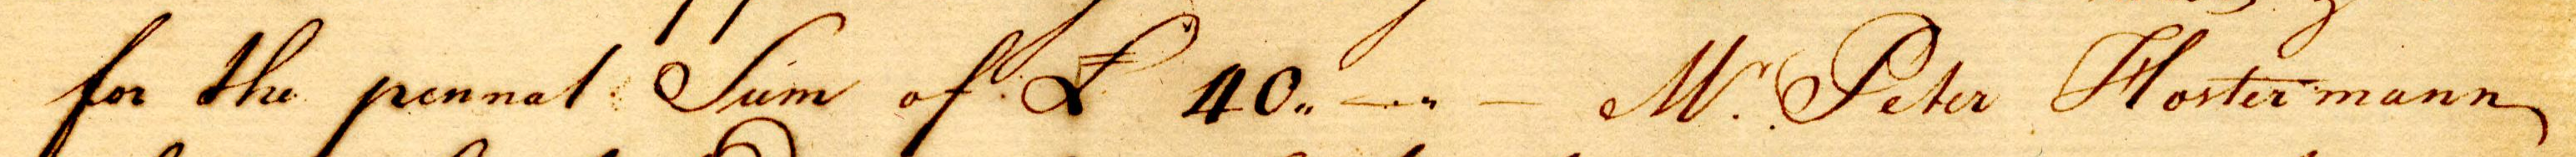for the pennal Sum of £40. M^r. Peter Flostermann
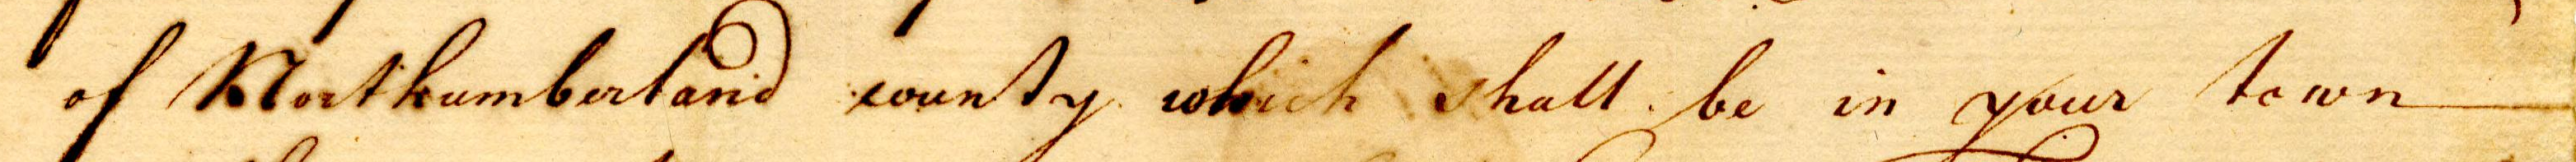of Klorthumberland county which shall be in your town
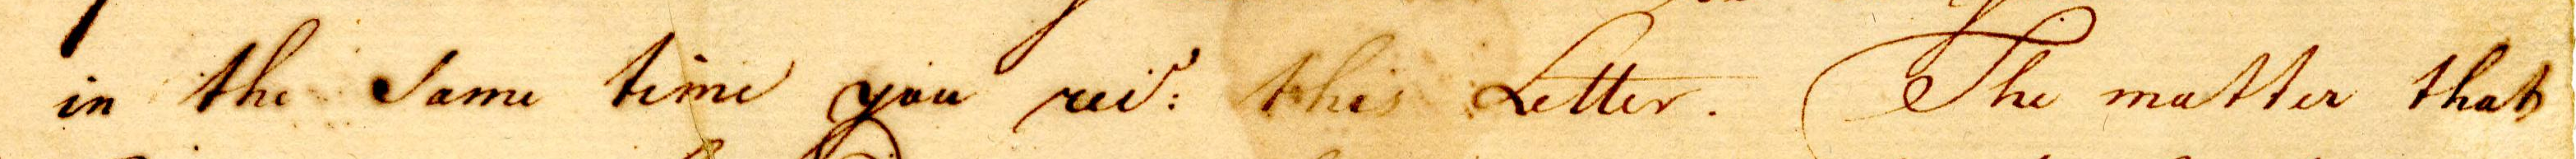in the Same time you rec^d. this Letter. The matter that
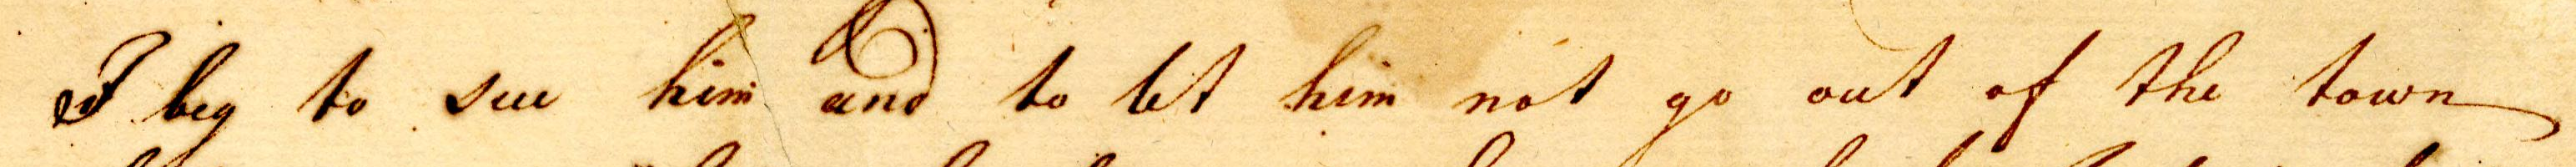I beg to sue him and to let him not go out of the town
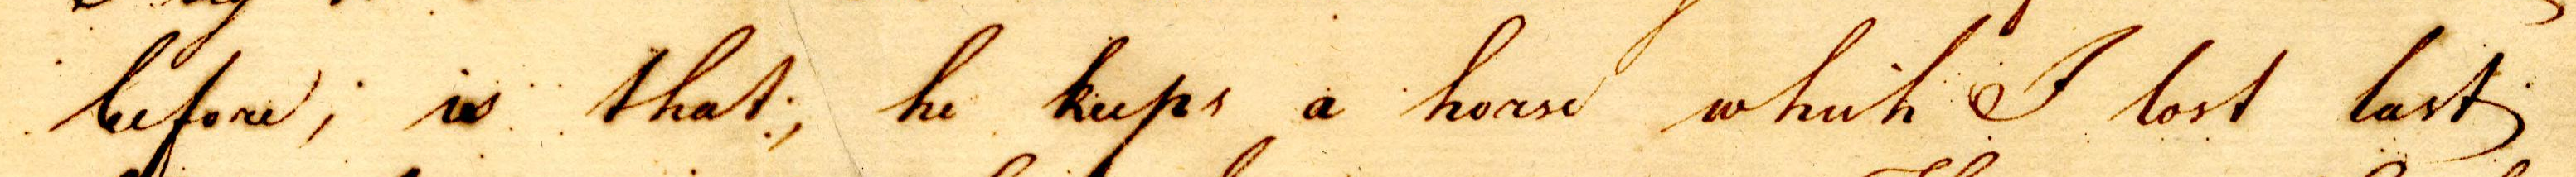before; is that, he keeps a horse which I lost last
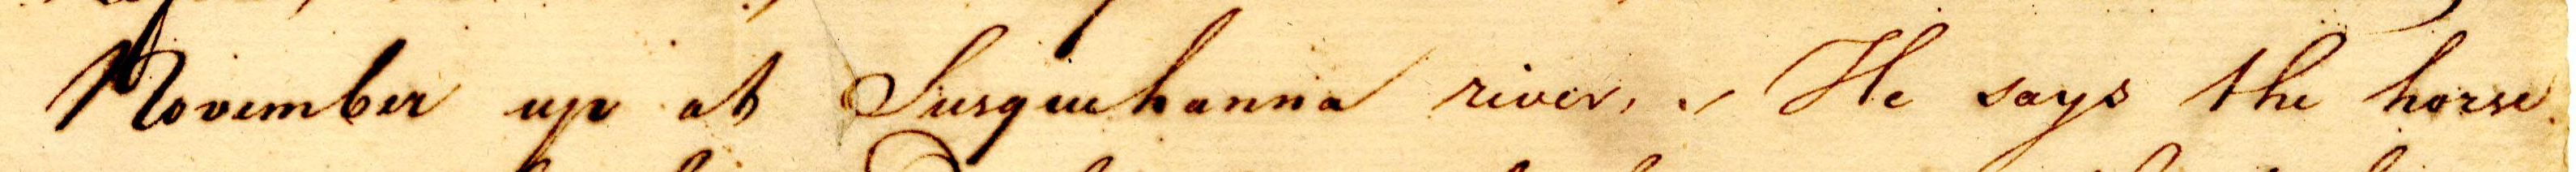November up at Susquehanna river. He says the horse
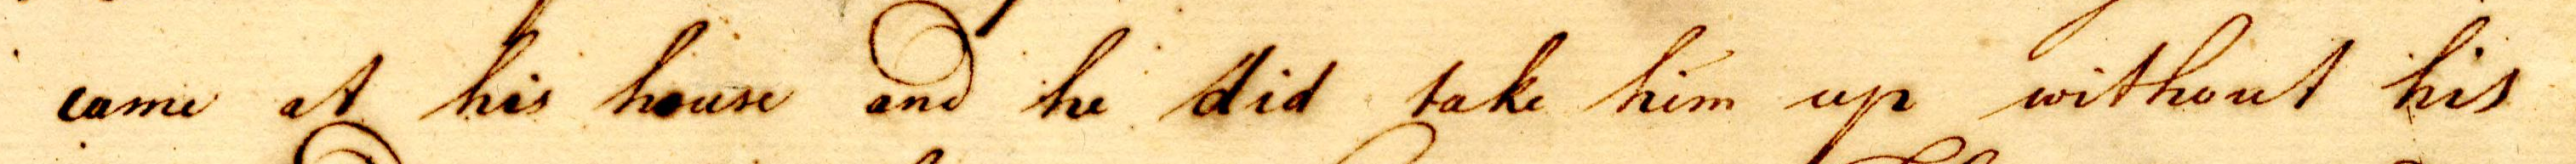came at his house and he did take him up without his
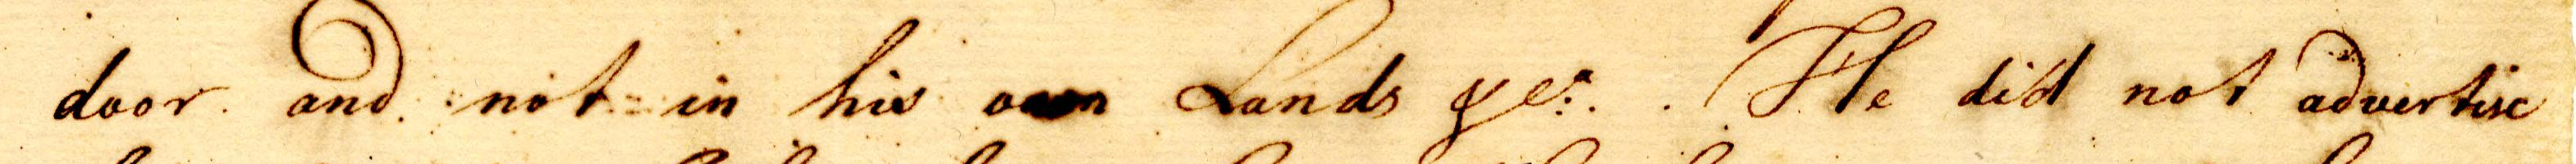door and not in his own Lands &c. He did not advertise
